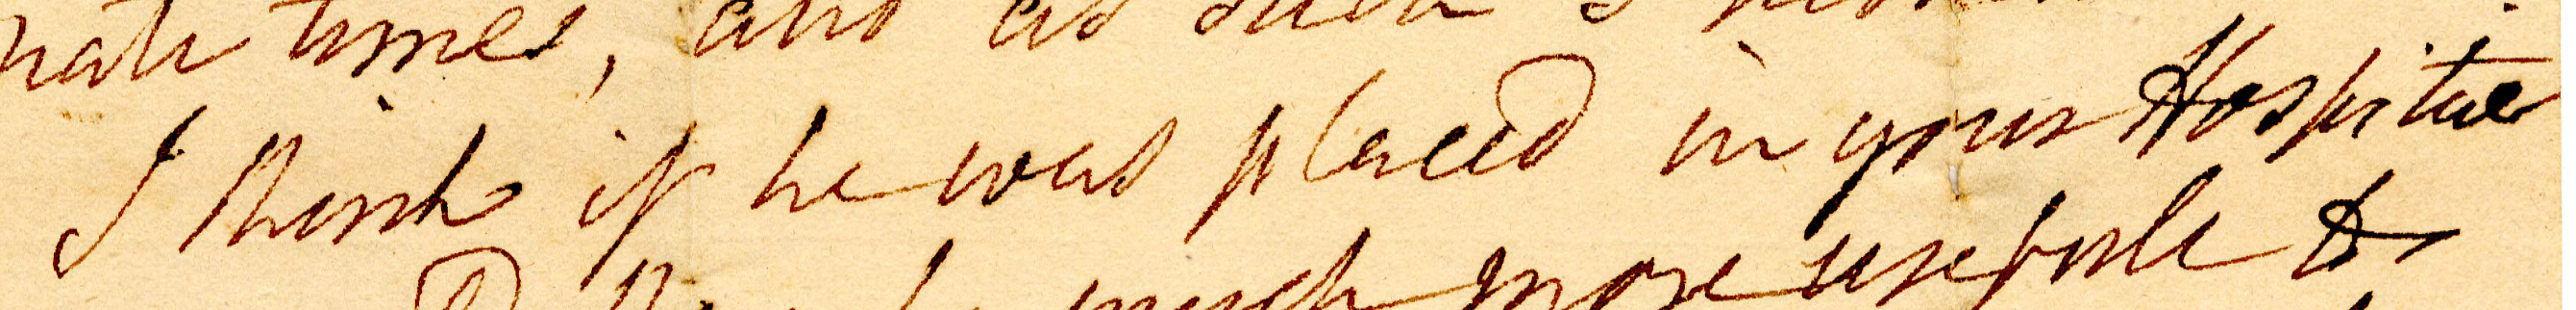I think if he were placed in your Hospital
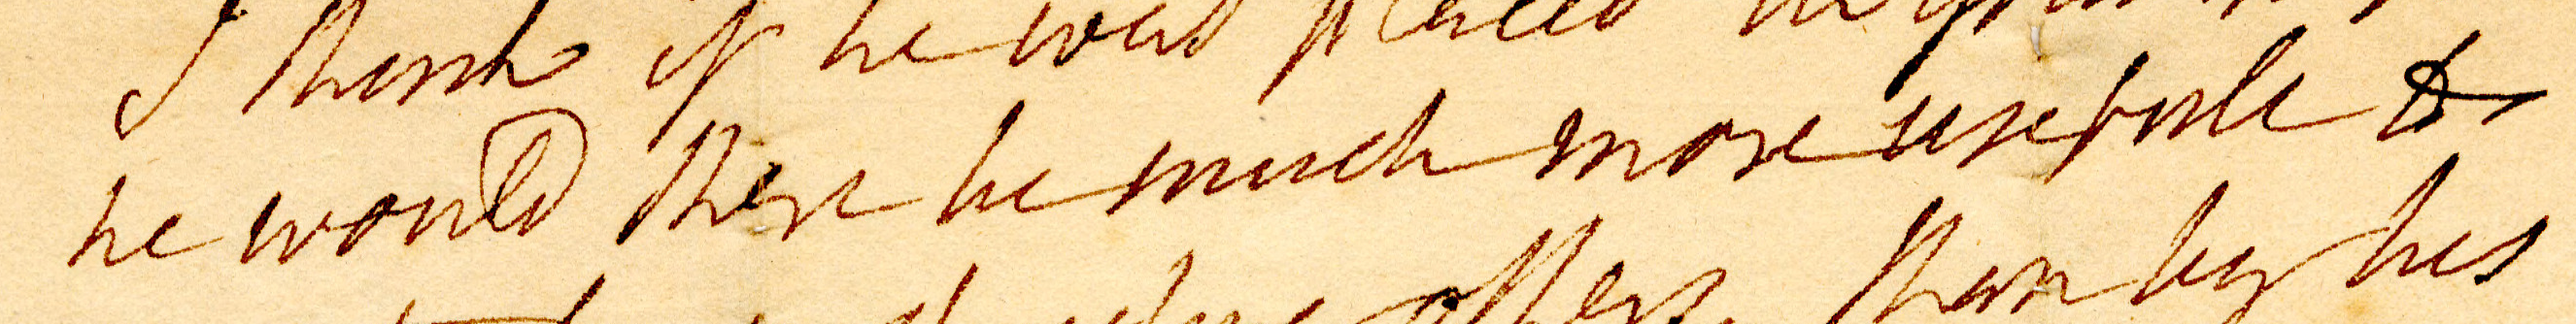he would there be much more useful to
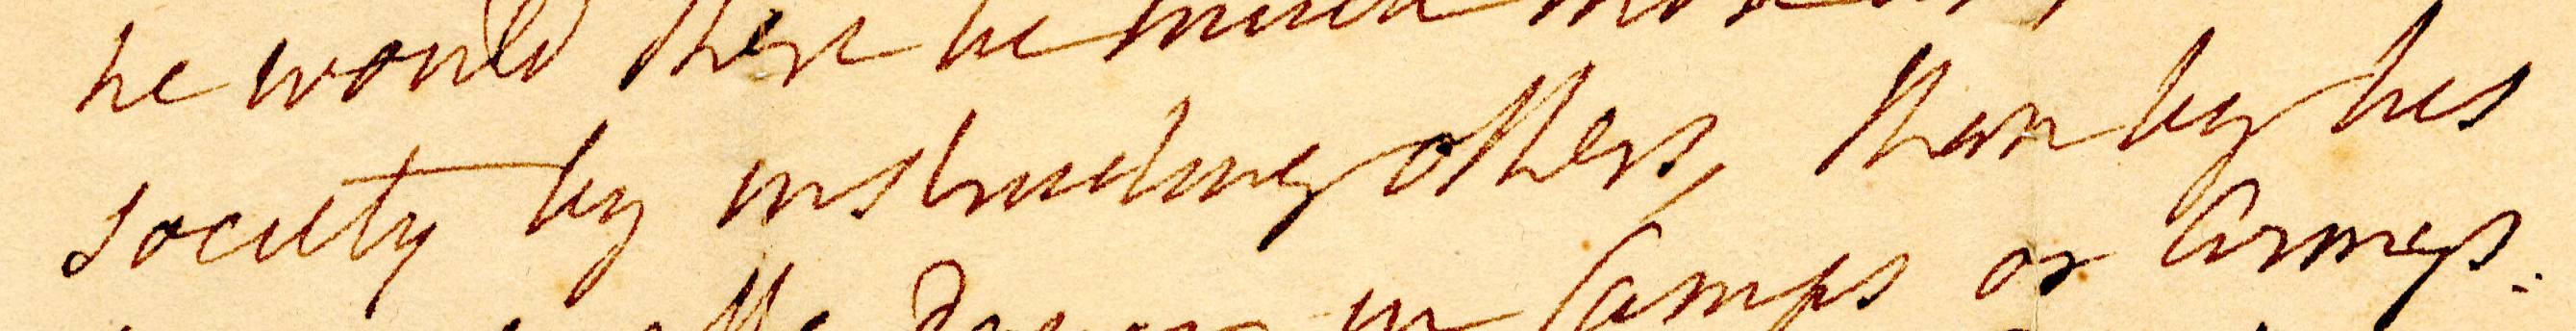society by instructing others, than by his
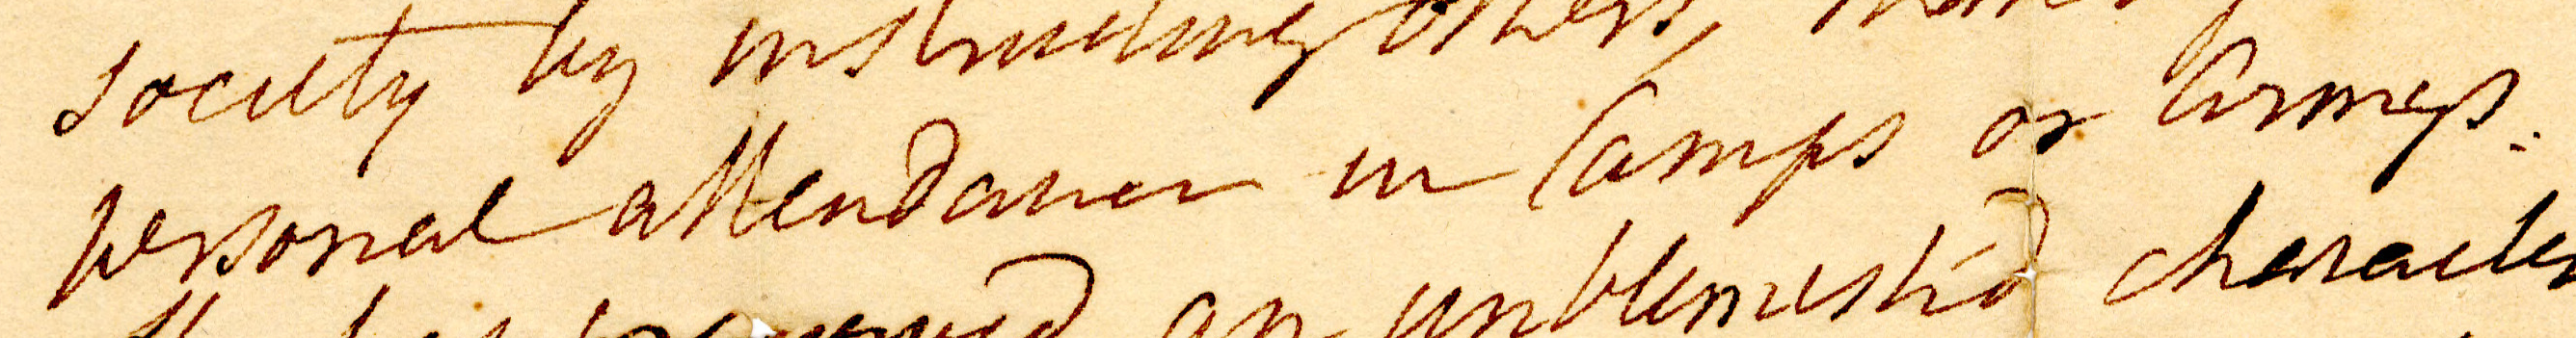personal attendance in Camps or Armys.
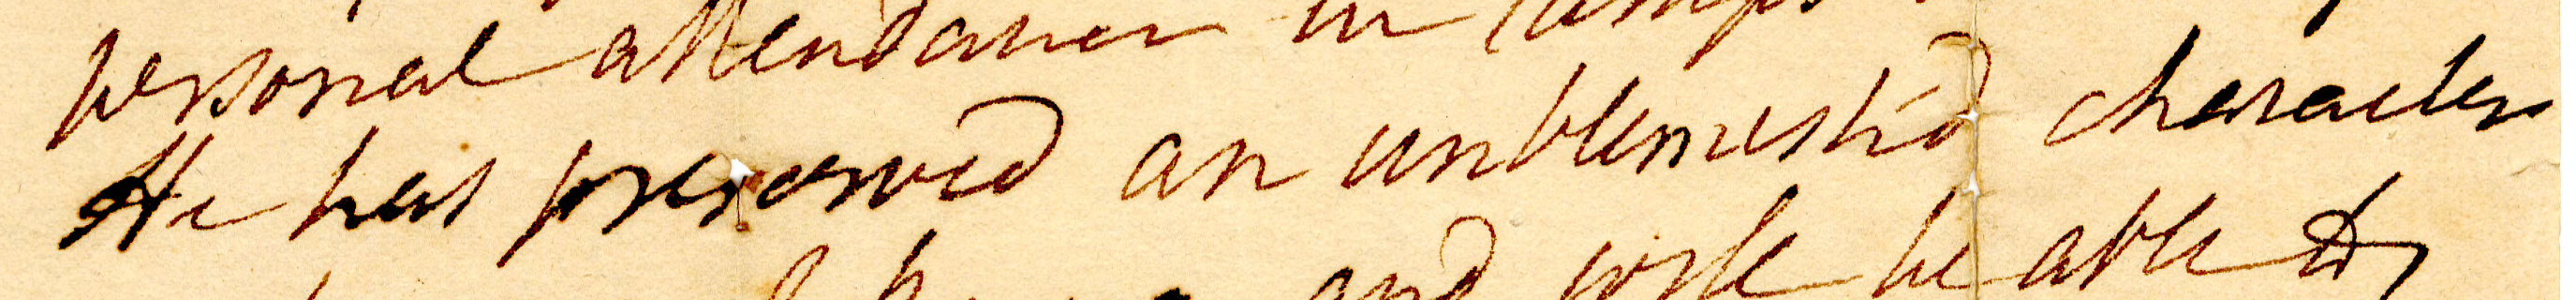He has preserved an unblemished character
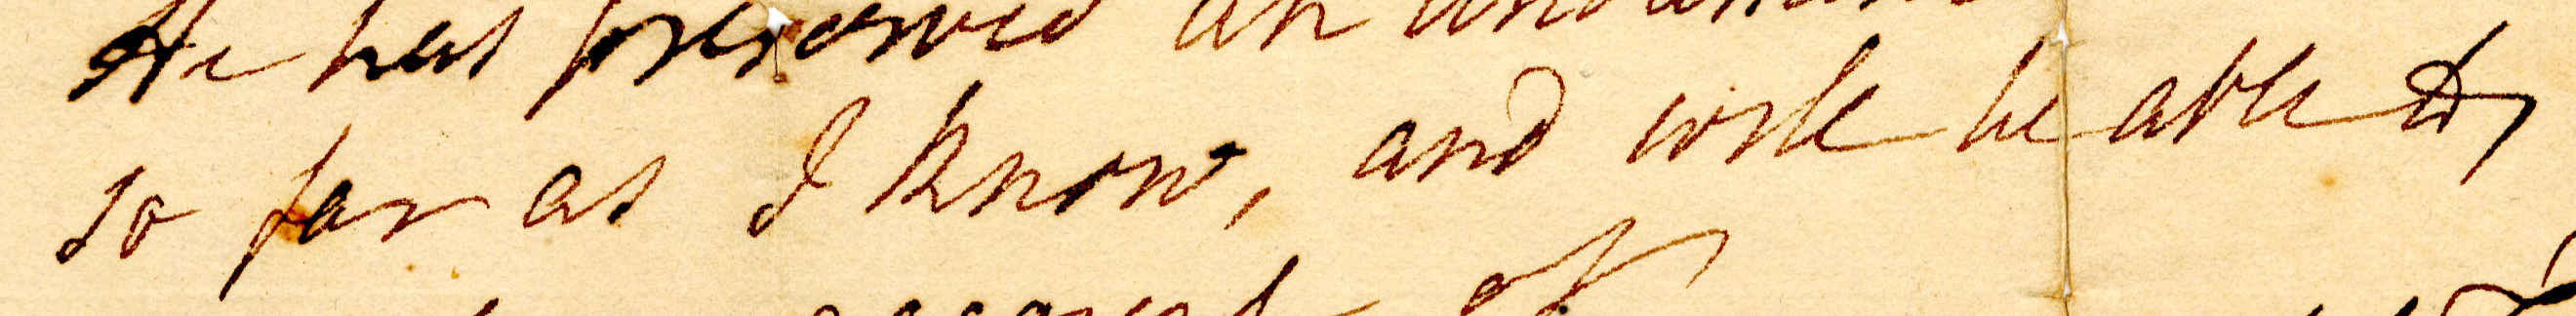so far as I know, and will be able to
